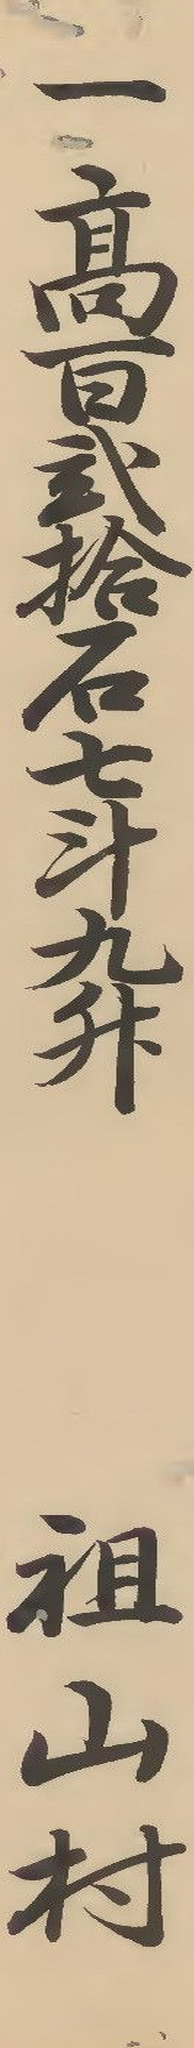一高百弐拾石七斗九升祖山村
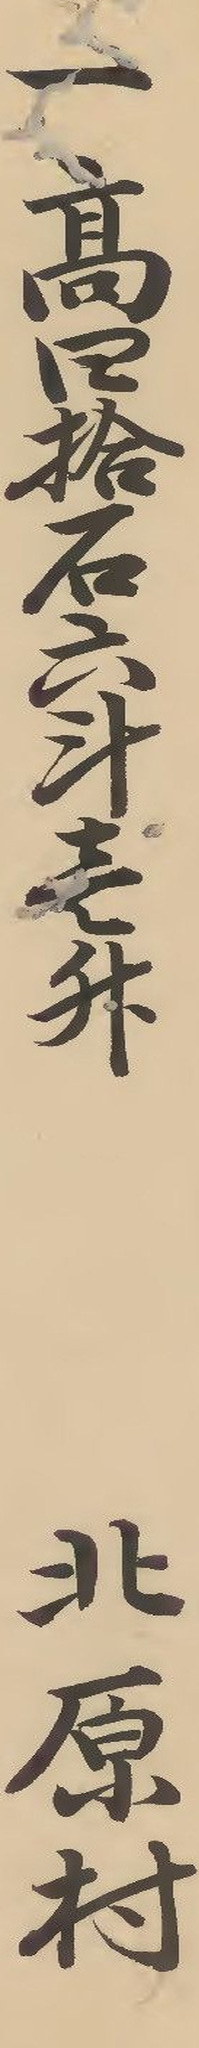一高四拾石六斗壱升北原村
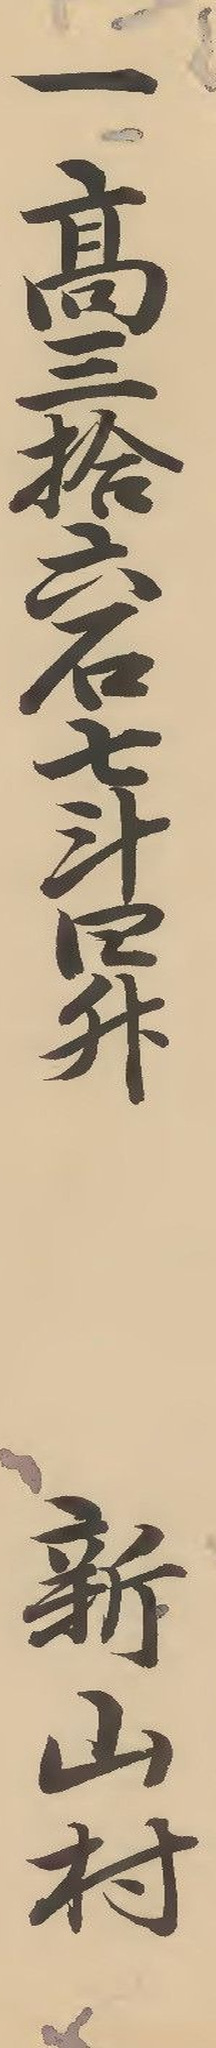一高三拾六石七斗四升新山村
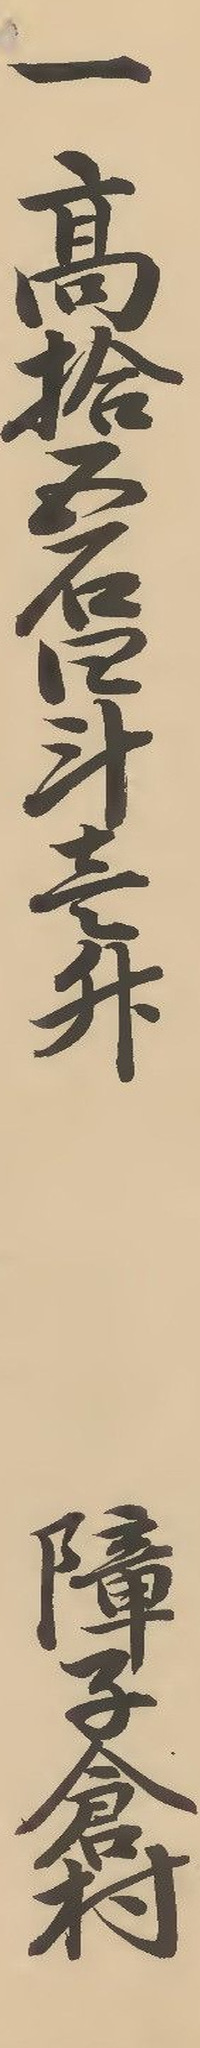一高拾五石四斗壱升障子倉村
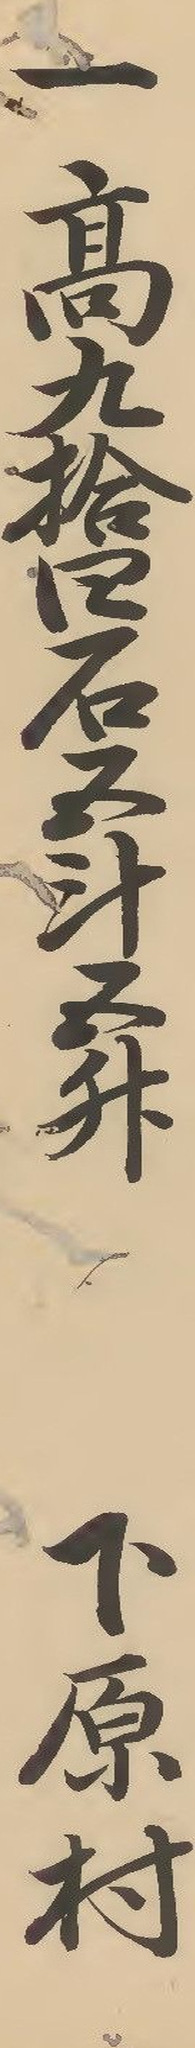一高九拾四石五斗五升下原村

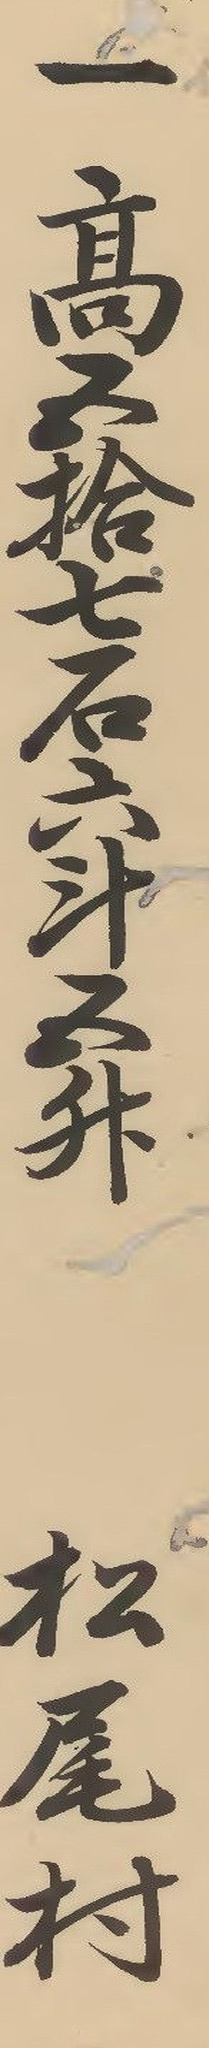一高五拾七石六斗五升松尾村

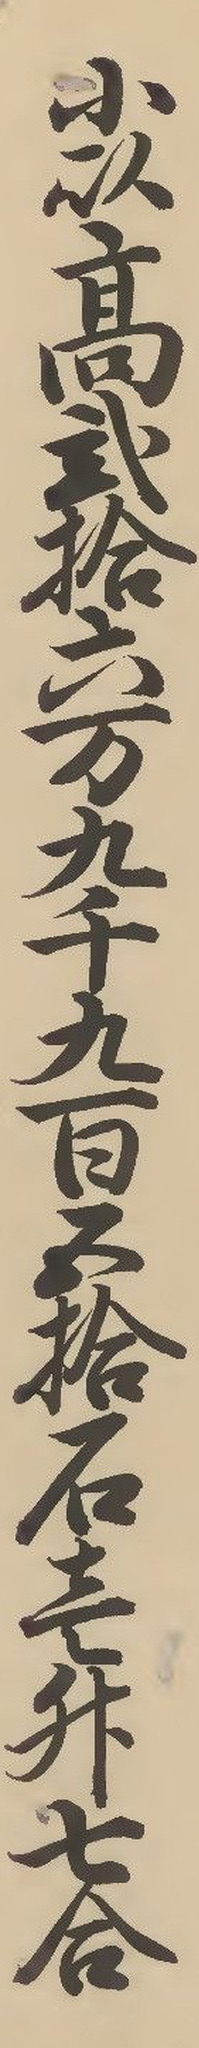小以高弐拾六万九千九百五拾石壱升七合
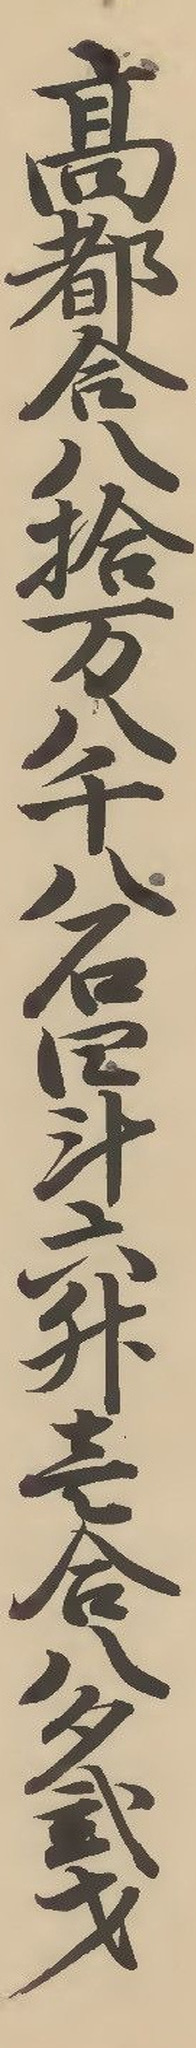高都合八拾万八千八石四斗六升壱合八勺弐才
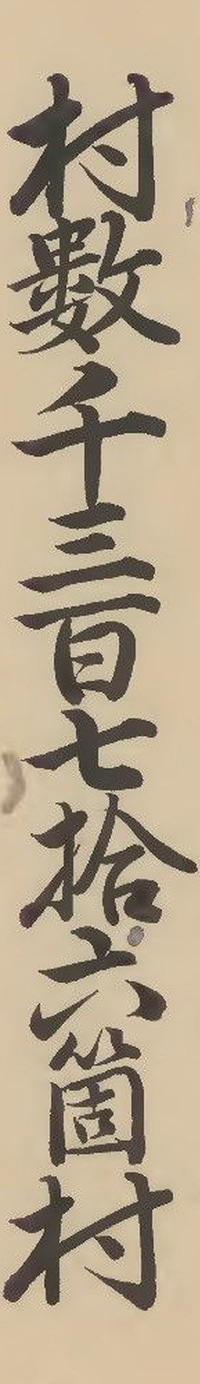村数千三百七拾六箇村

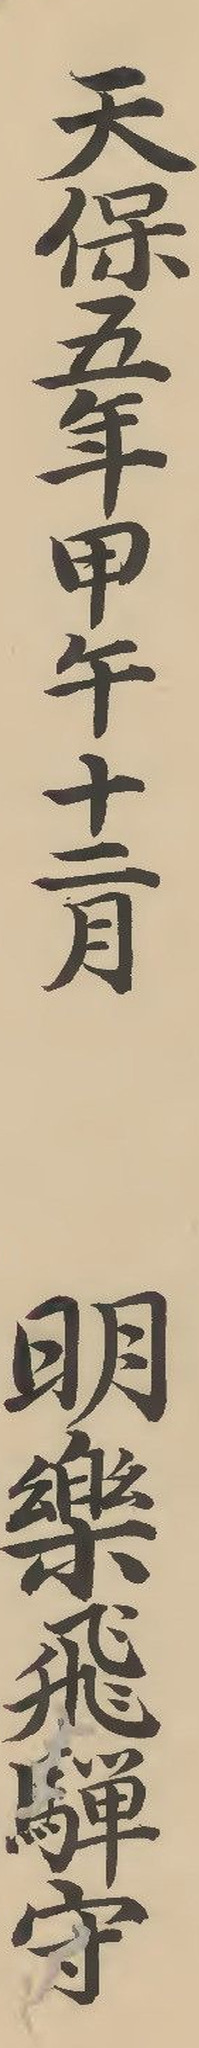天保五年甲午十二月明楽飛騨守
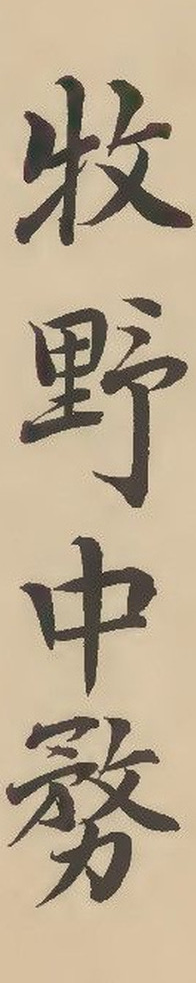牧野中務
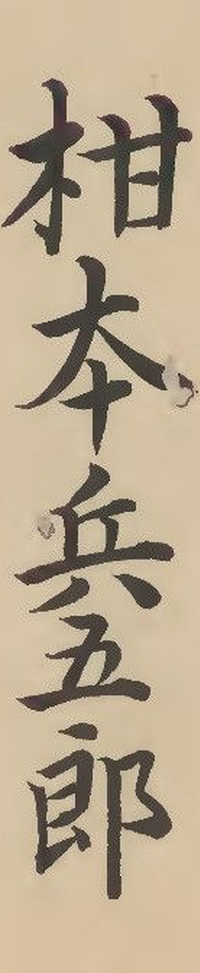柑本兵五郎
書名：越中国郷帳
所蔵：国立公文書館 National Archives of Japan
